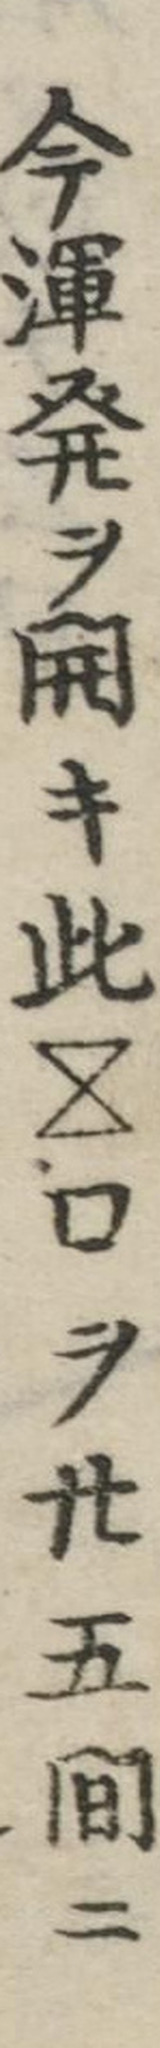今渾発ヲ開キ此▽△口ヲ廿五間ニ
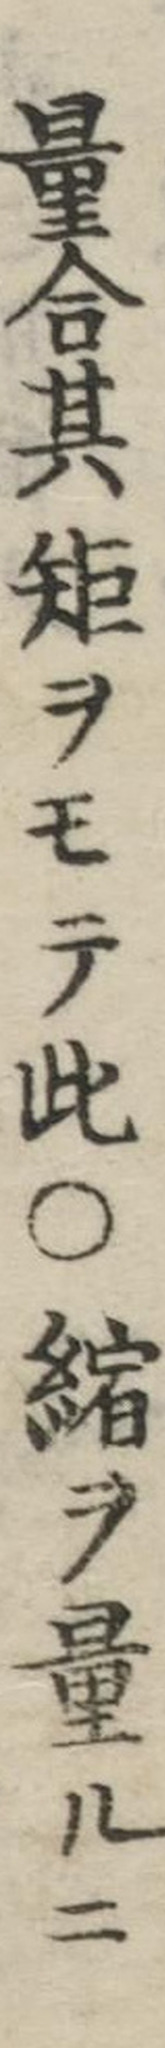量合其矩ヲモテ此○縮ヲ量ルニ
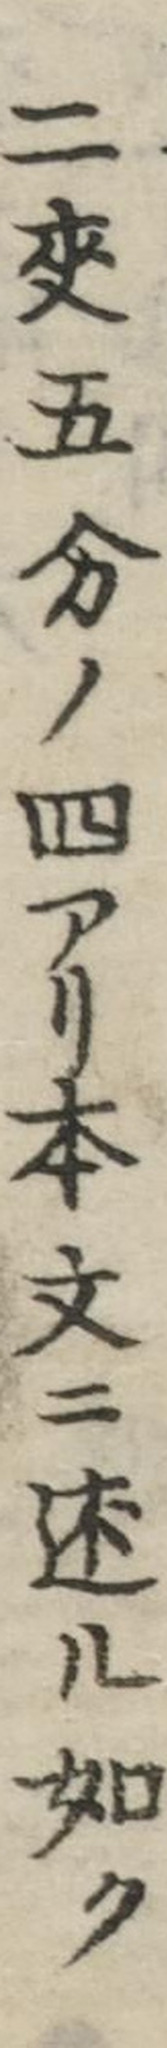二夾五分ノ四アリ本文ニ述ル如ク
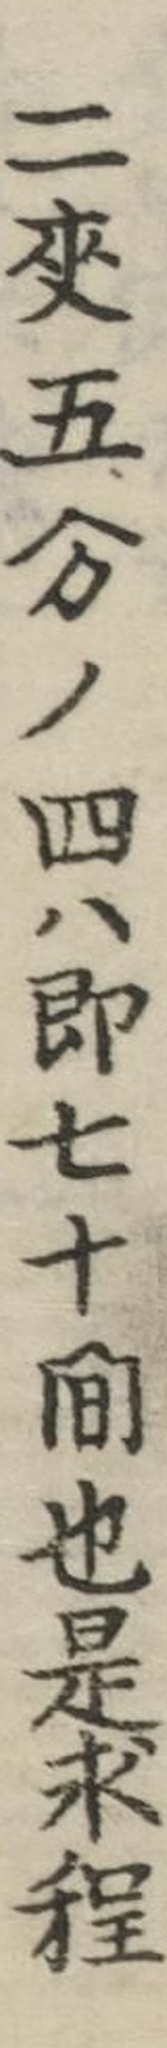二夾五分ノ四ハ即七十間也是求程
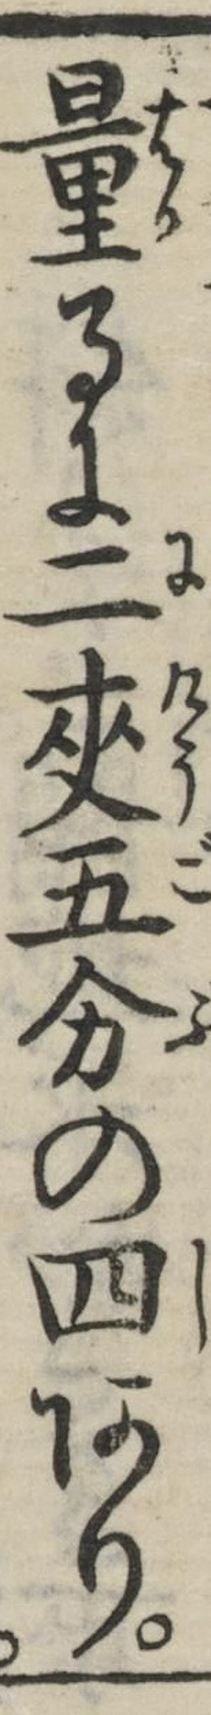量るにニ夾五分の四あり。
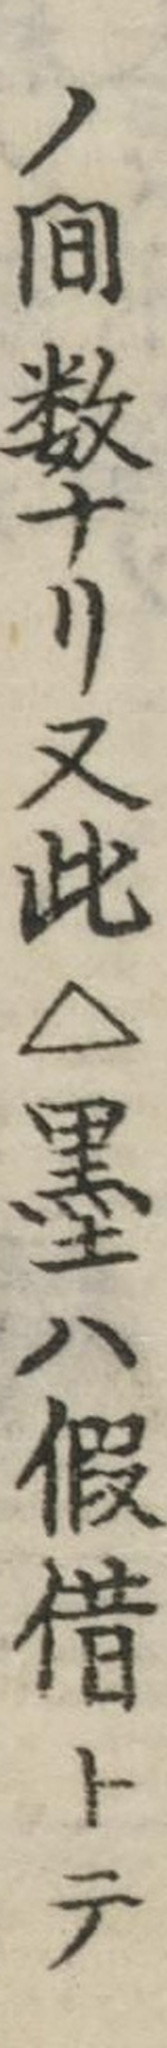ノ間数ナリ又此△墨ハ仮借トテ
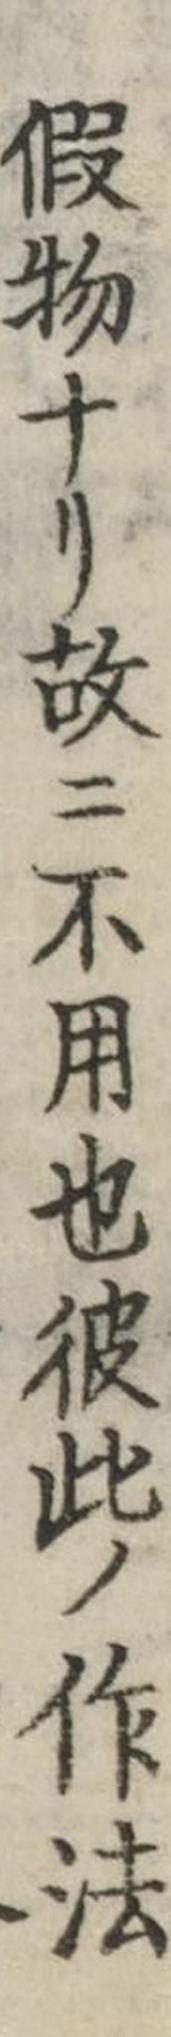仮物ナリ故ニ不用也彼此ノ作法
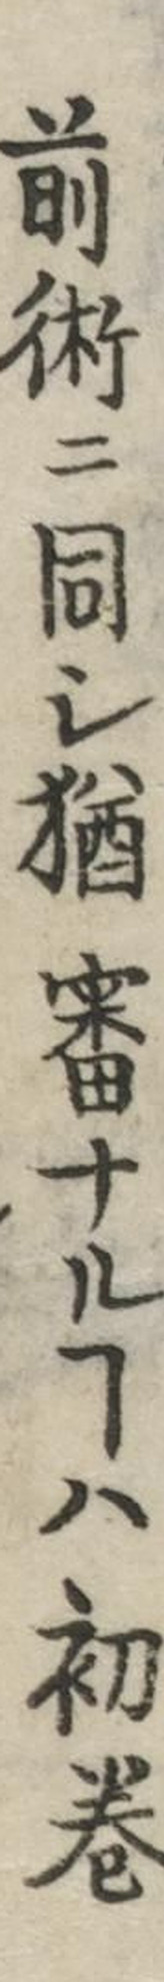前術ニ同シ猶審ナルヿハ初巻
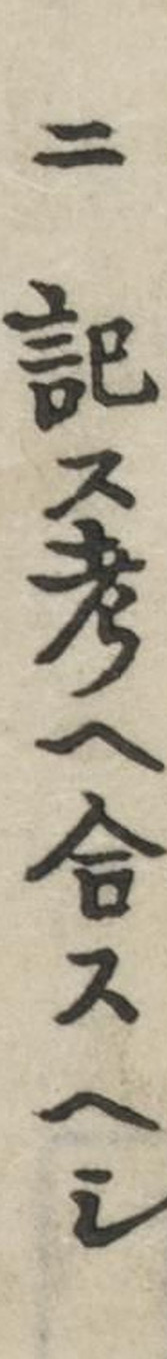ニ記ス考へ合スヘシ
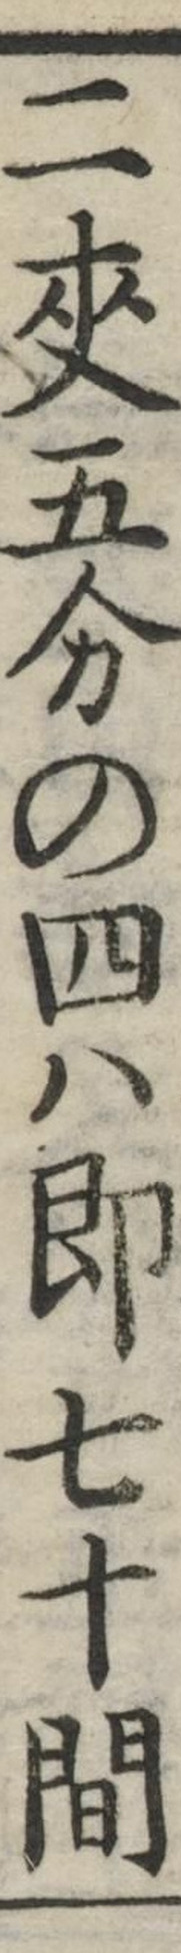二夾五分の四は即七十間
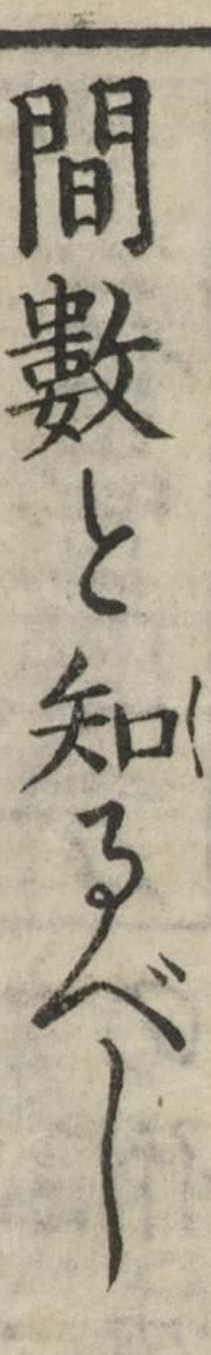間数と知るべし

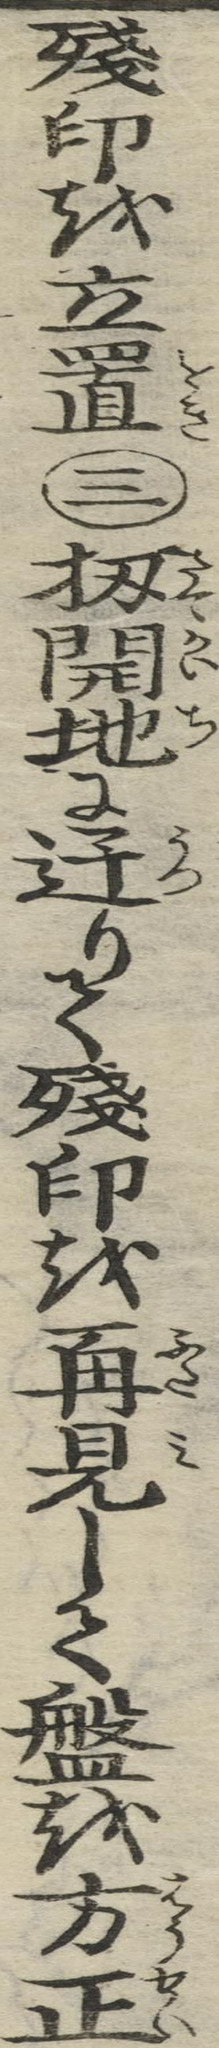残印を立置㊂扨開地に迂りて残印を再見して盤を方正
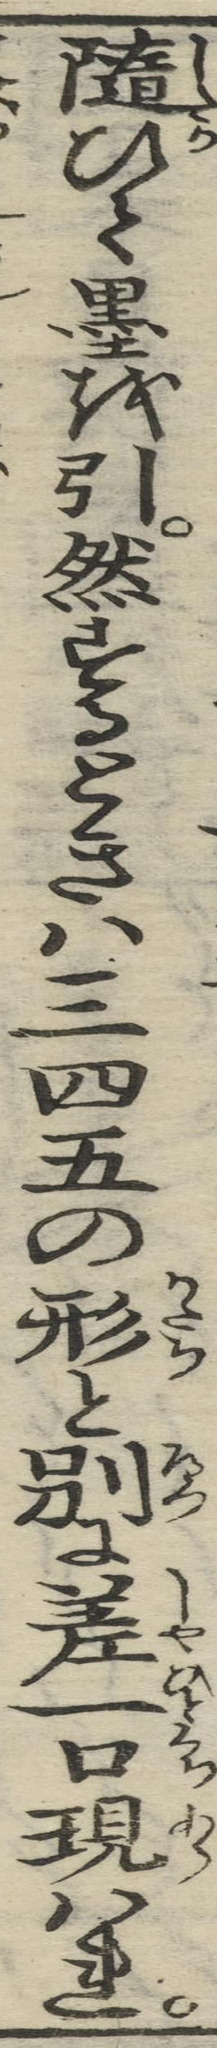随ひて墨を引。然するときは三四五の形と別に差一口現はれ。
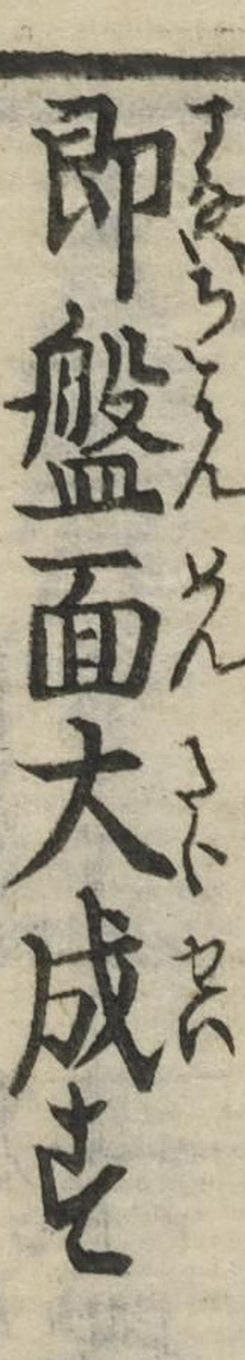即盤面大成す
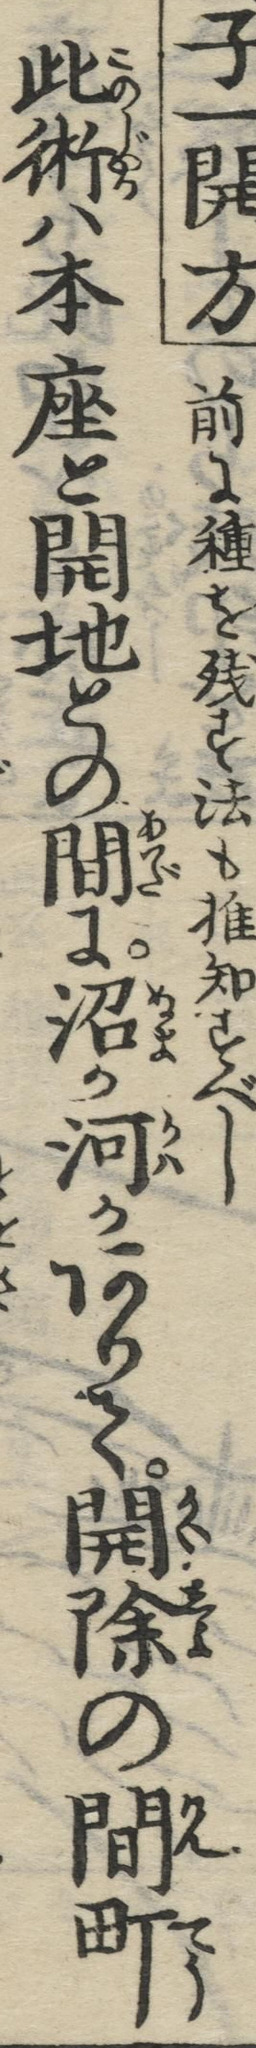此術は本座と開地との間に。沼か河かありて。開除の間町
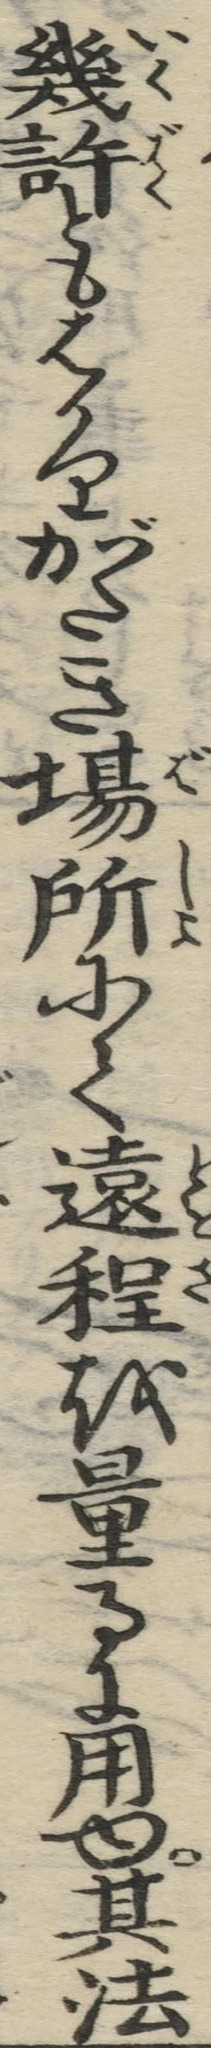幾許ともはかりがたき場所にて遠程を量るに用ゆ。其法
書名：量地指南　巻之二（内題）
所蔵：東京大学地震研究所図書室 Earthquake Research Institute Library, The University of Tokyo, JAPAN
